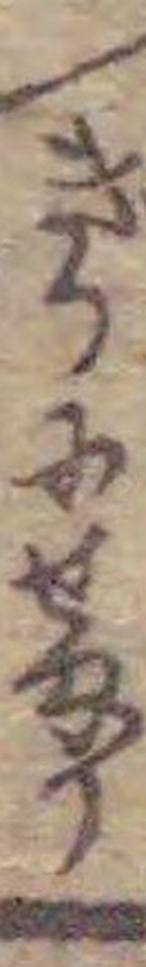ぎりにせまり
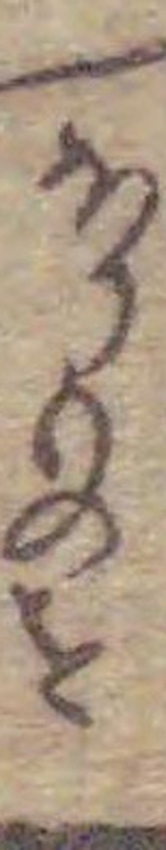ほりものを
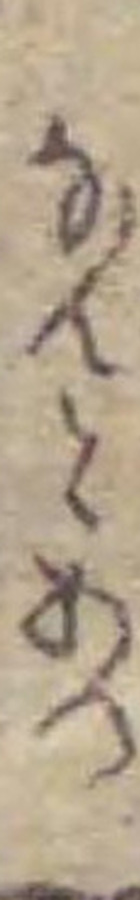なんとあつ
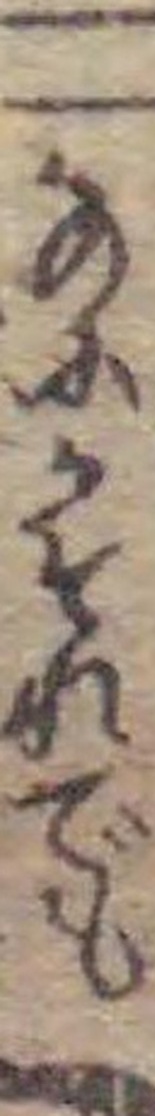なにかそれでも
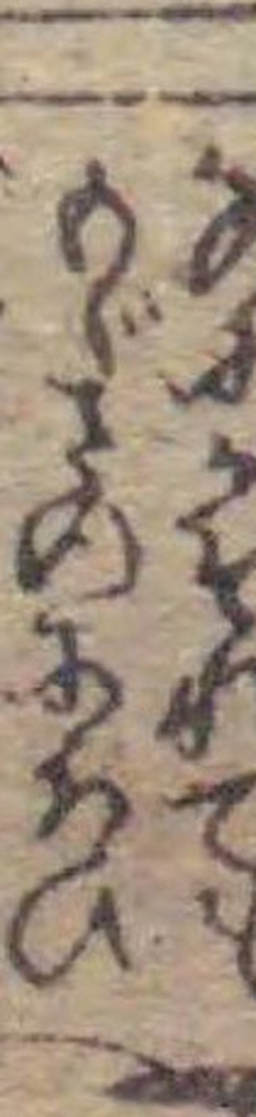もぐさのにほひ
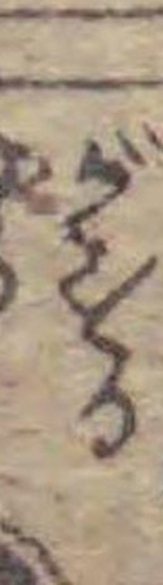がする

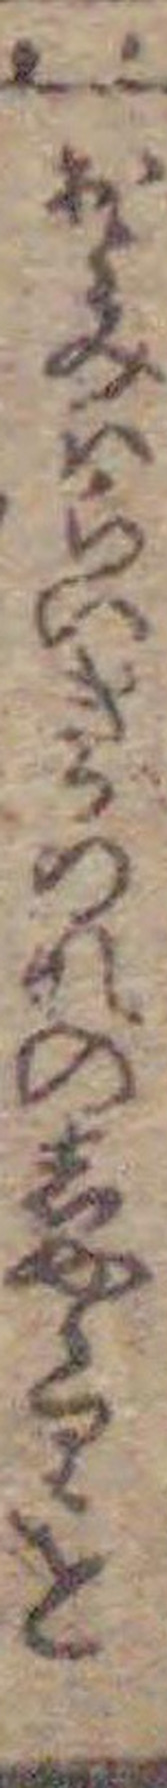おとみはらいきかつれのしやりを
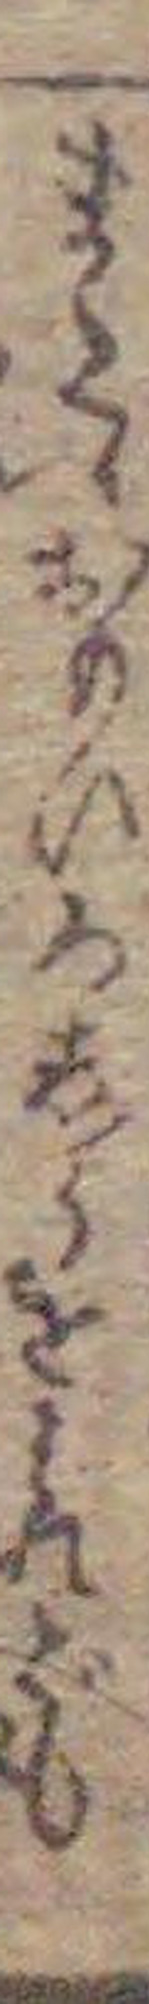まことゝおもいろしうをみれども
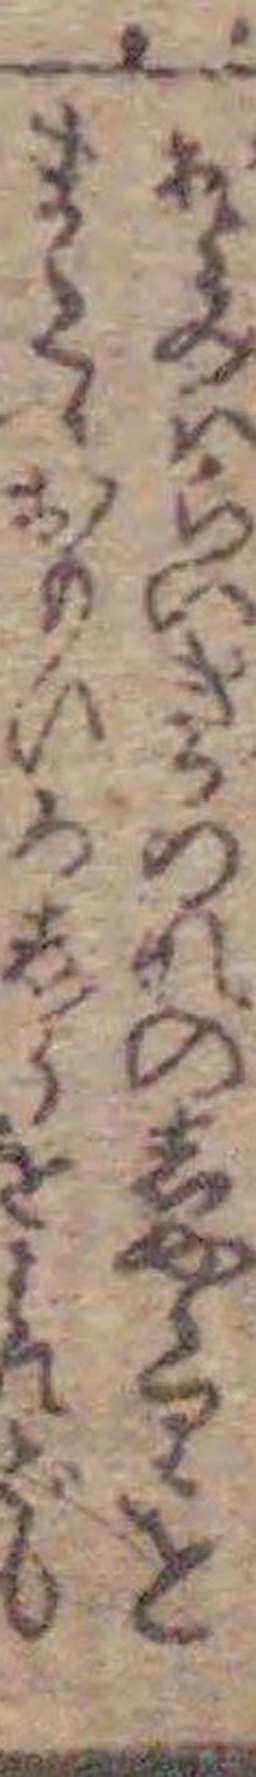まことゝおもいろしうをみれども
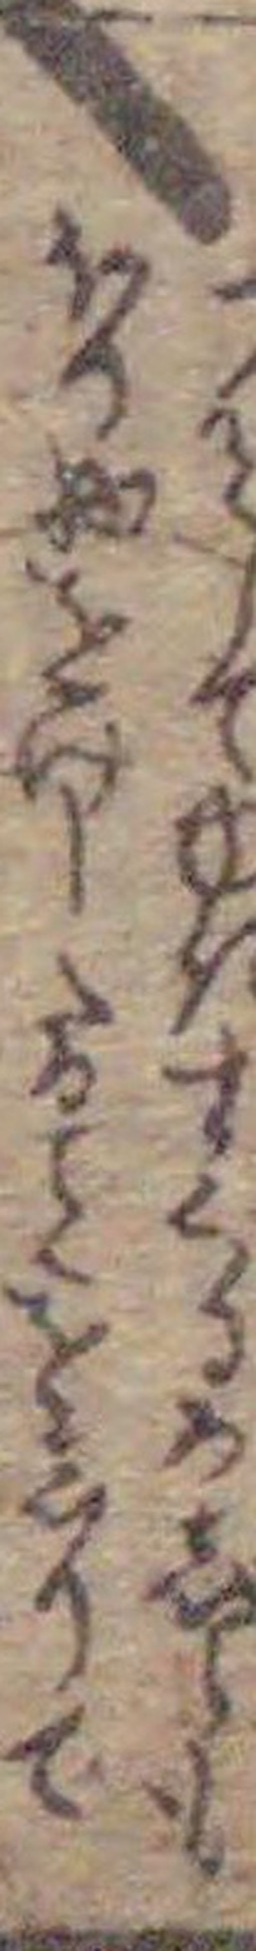ほり物をけしたることをしりて
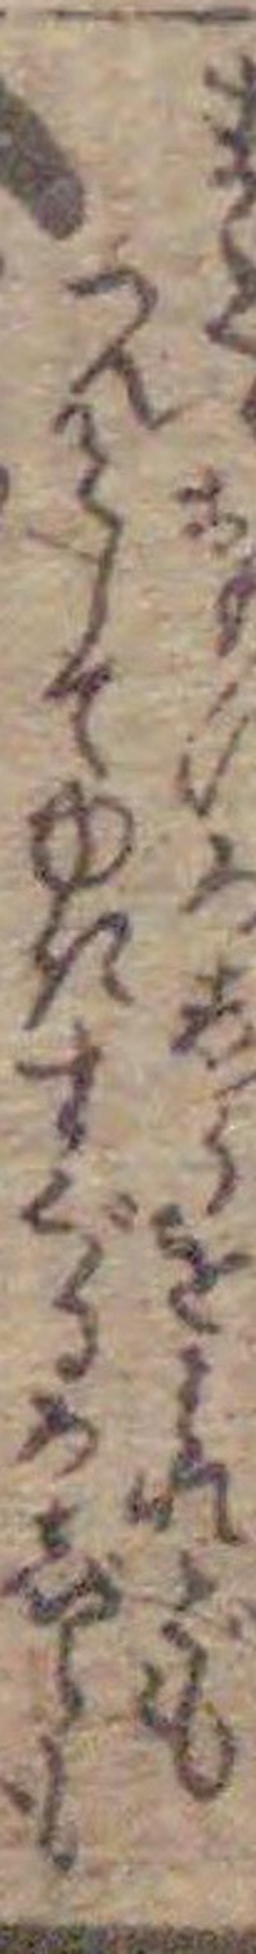つんとしてゆきすぐるろじうも
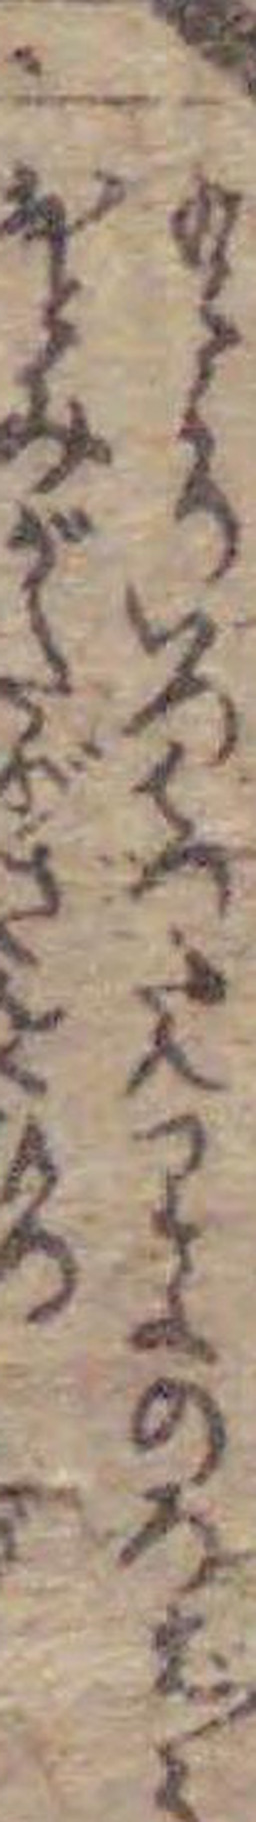おとみがたぶさをひつ
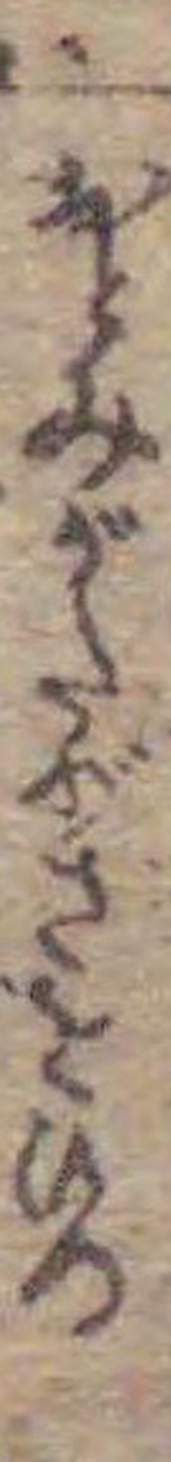おとみがたぶさをひつ
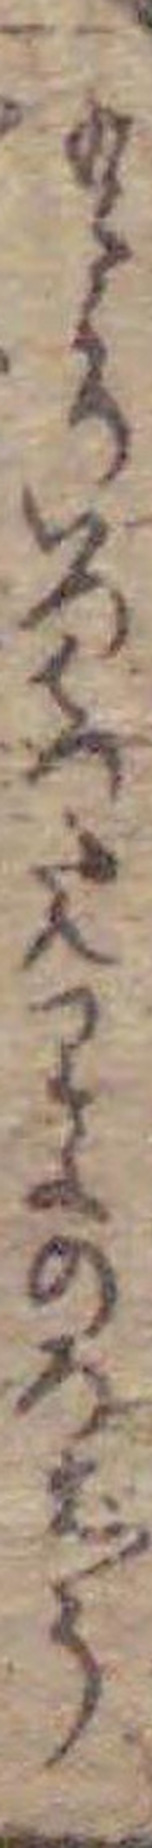もとよりいつてつたんりよのろじう
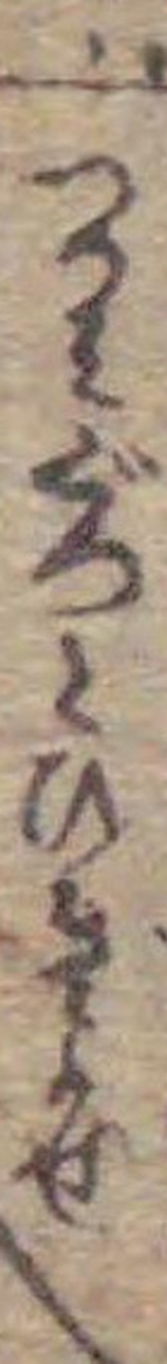つかみぐつとひきよせ
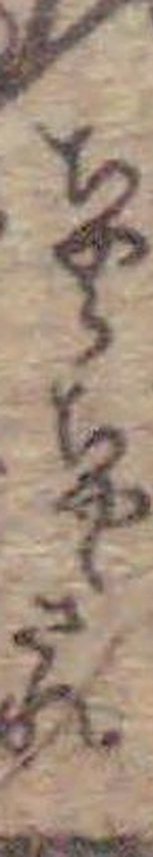ちやうちやくされ
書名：芸者呼子鳥 : 2巻（松泉堂）
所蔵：国立国会図書館 National Diet Library, JAPAN
